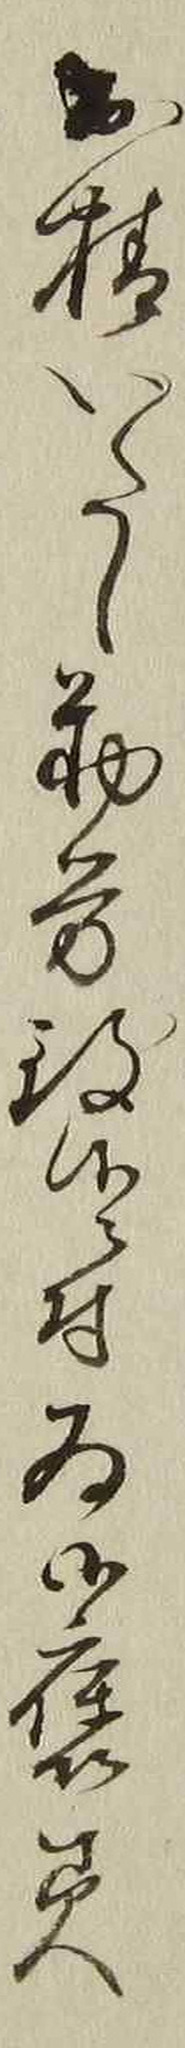出精いたし勤労致候ニ付為御褒美
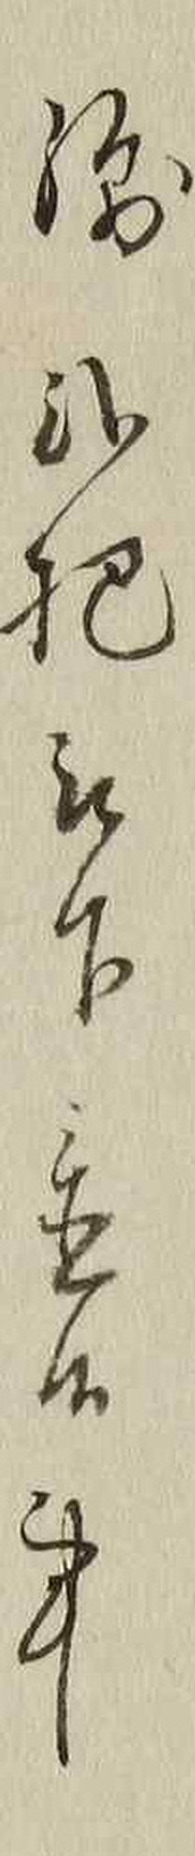綿弐把被下置候事
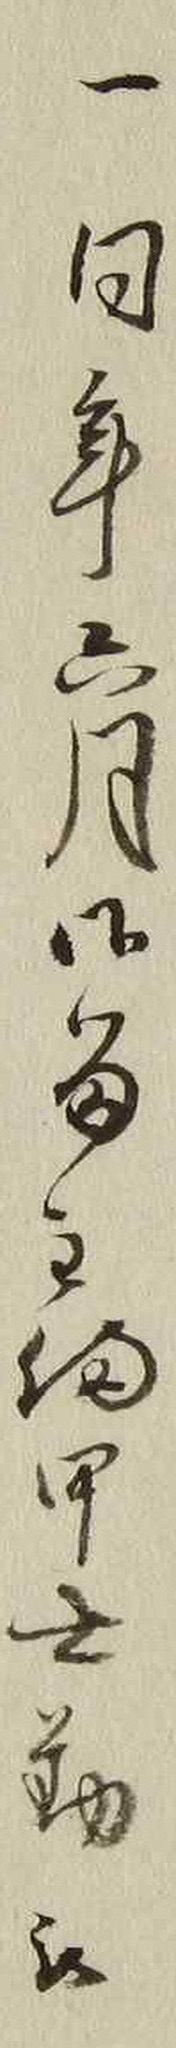一同年六月御留主備甲士勤被
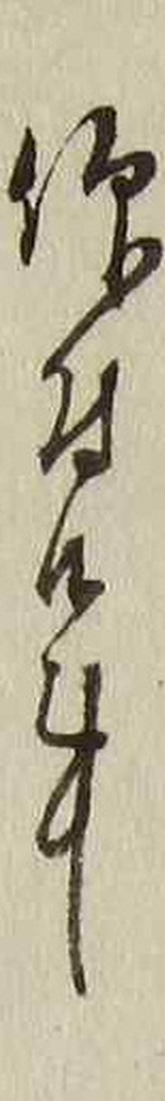仰付候事
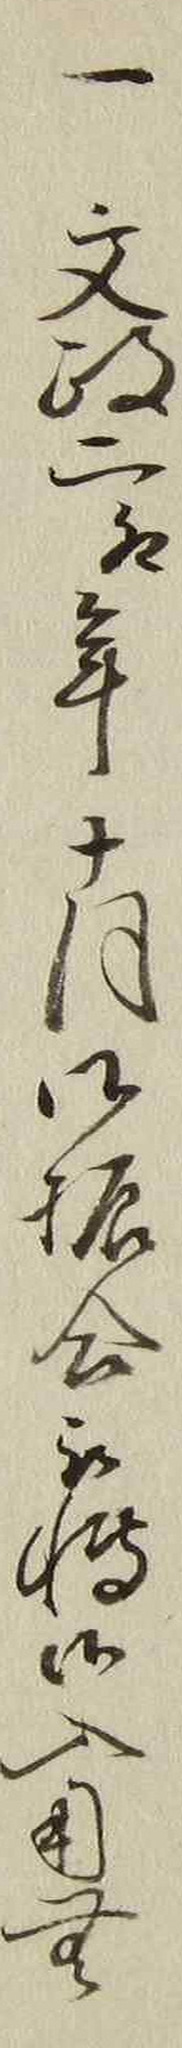一文政二卯年十月御振会被転御入用無
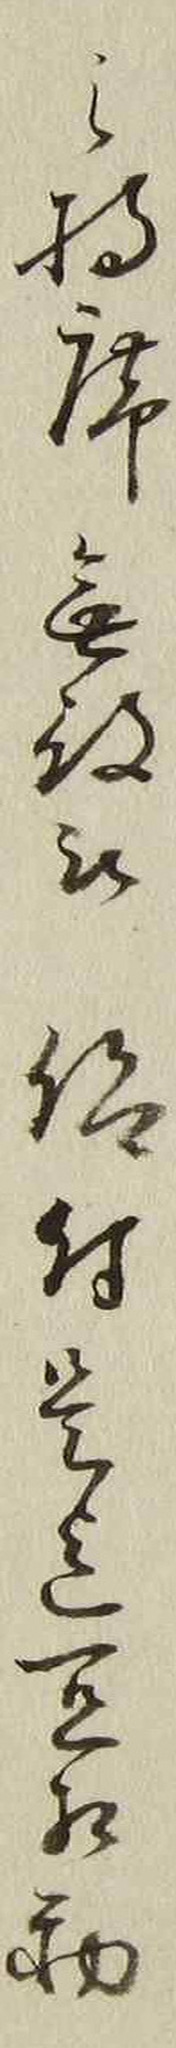之持席無役被仰付是迄宜相勤
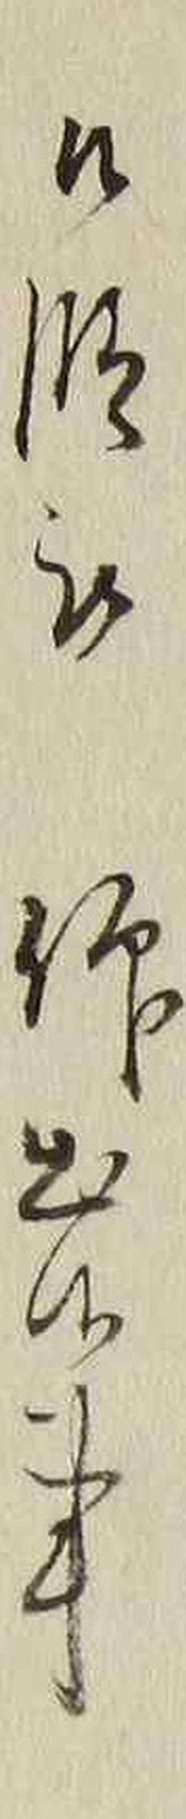候段被仰出候事
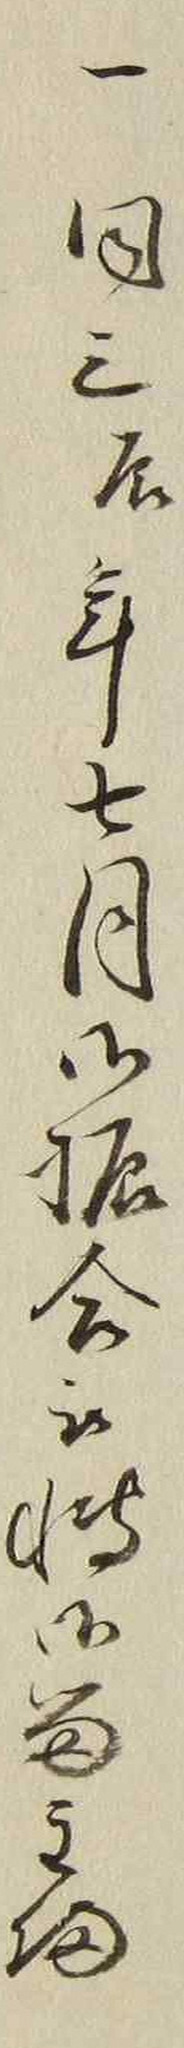一同三辰年七月御振会被転御留主備
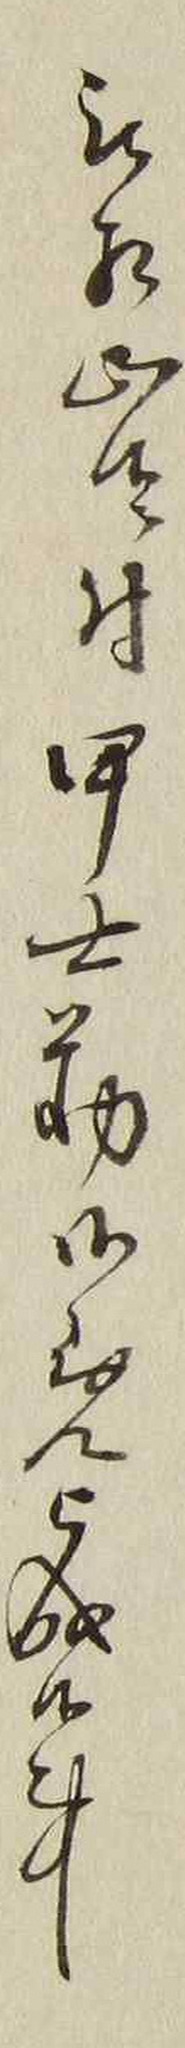被相止候ニ付甲士勤御免被成候事
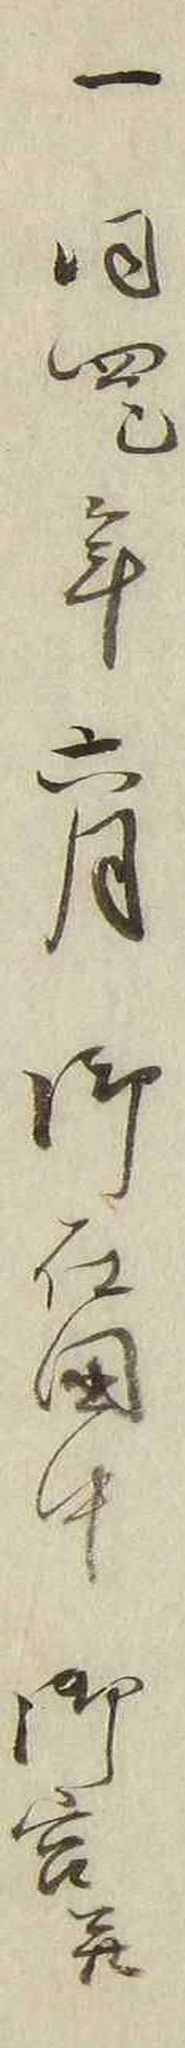一同四巳年六月御在国中御宮幷

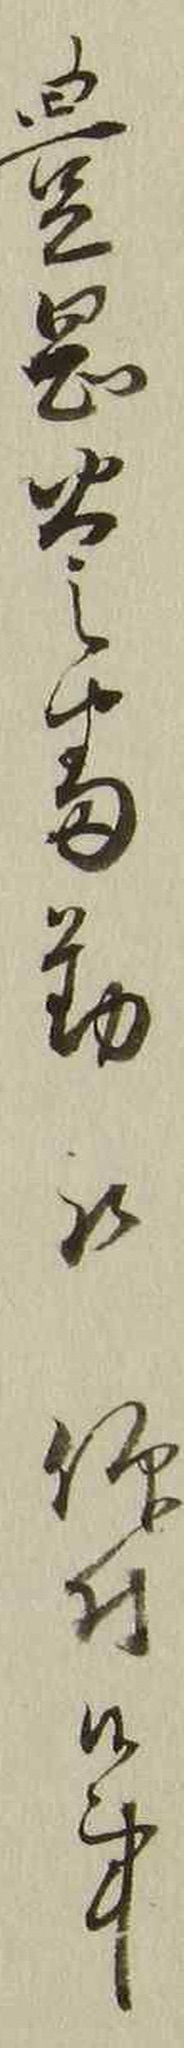豊岡火之番勤被仰付候事
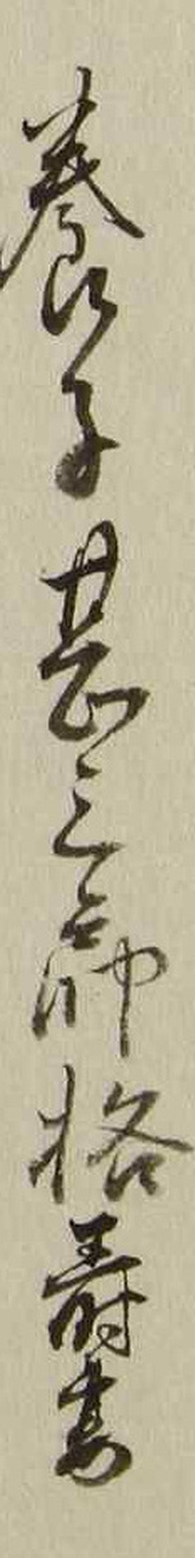女養子甚三郎格寿妻
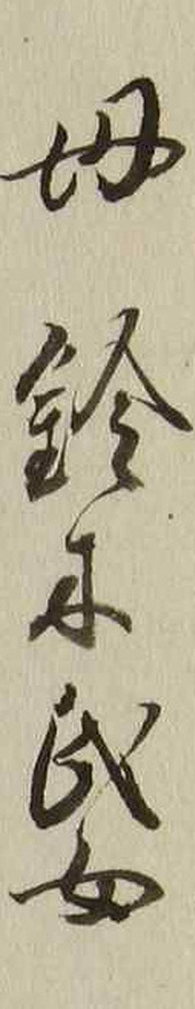母鈴木氏女
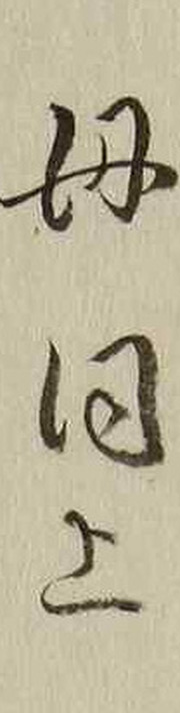母同上
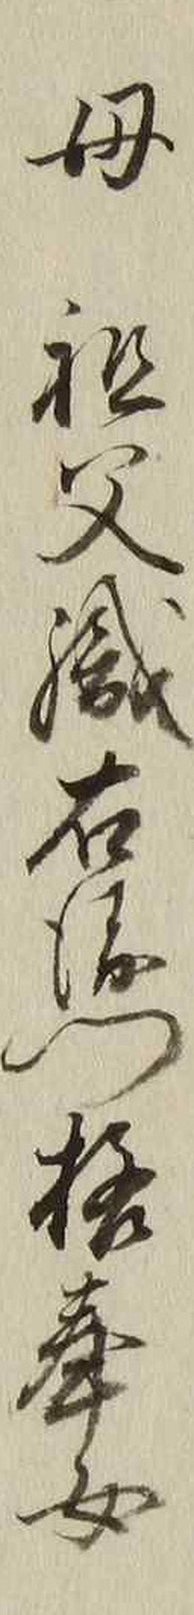母祖父織右衛門格奉女
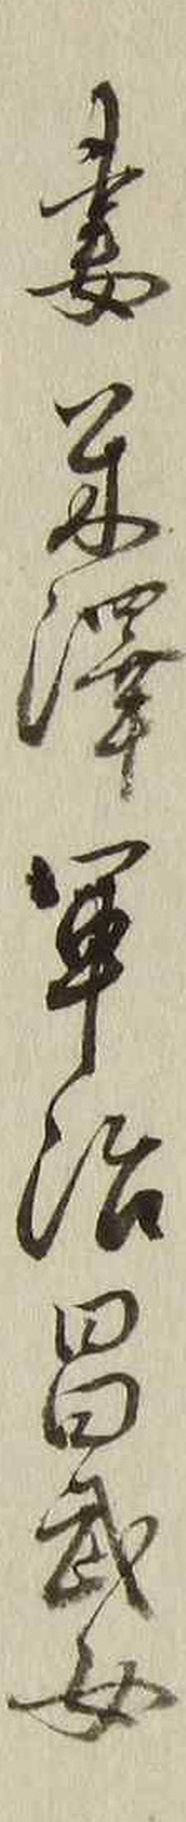妻米澤軍治昌武女
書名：諸士系譜　巻之129　た之部5
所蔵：会津若松市立会津図書館
